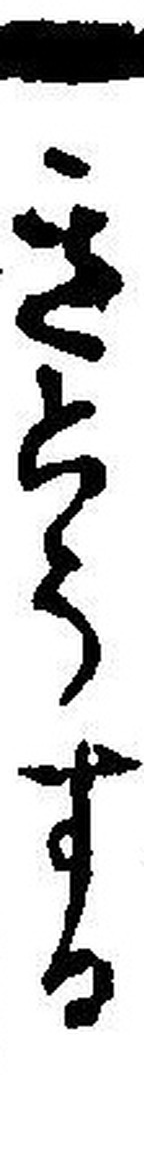きとうする

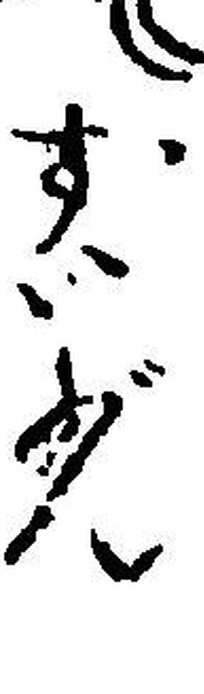ずいぶん
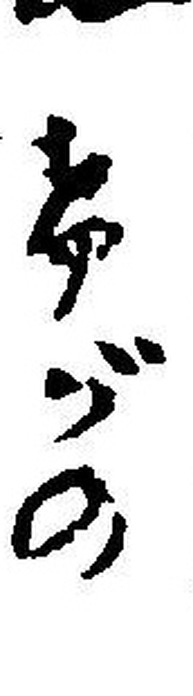けがの
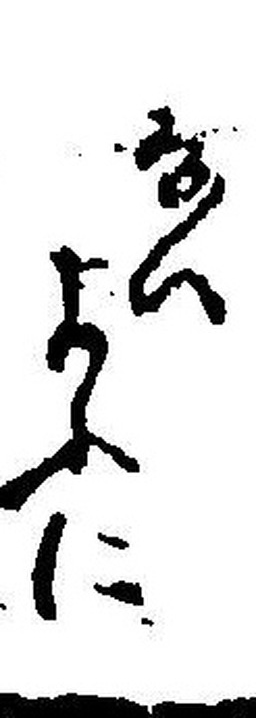よふに
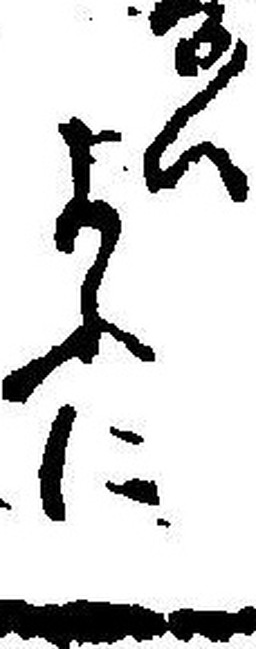よふに
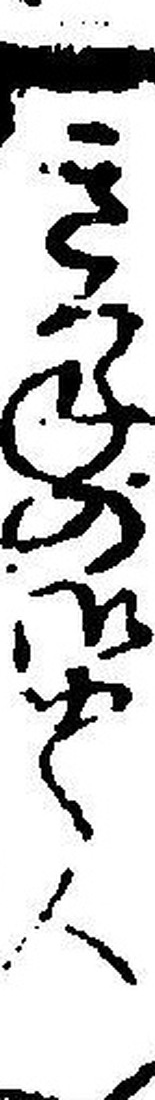きつねの御やく人
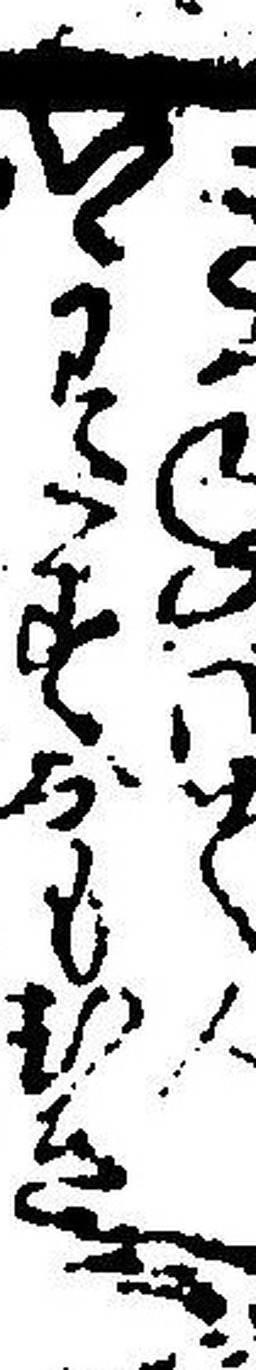いゝわたすおもむき
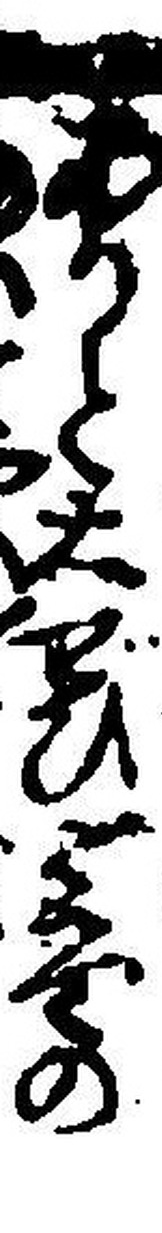ありと大ぜひみやの
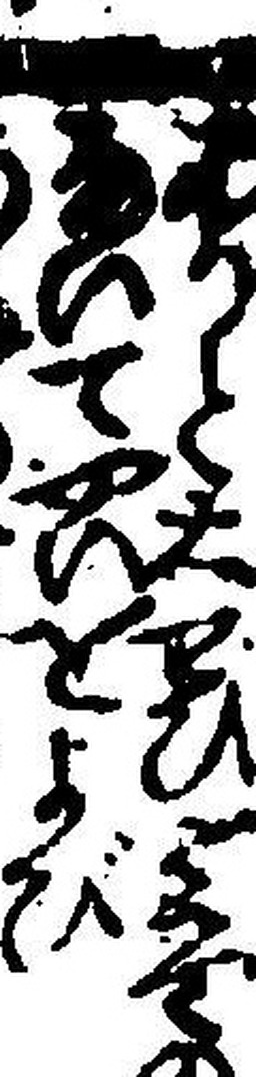ないてやいをよび
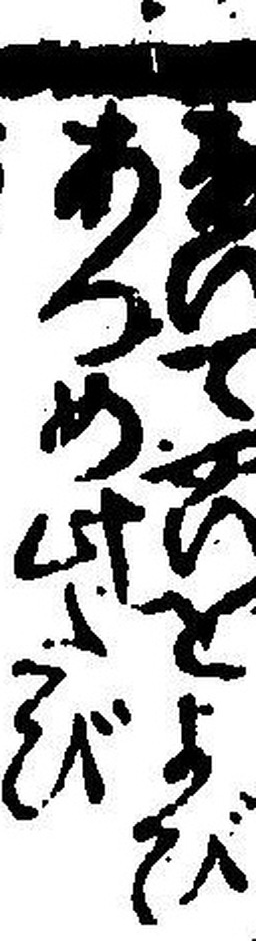あつめ此たび
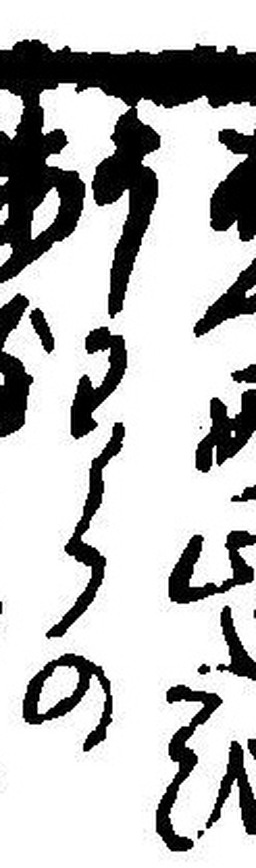よしわらの
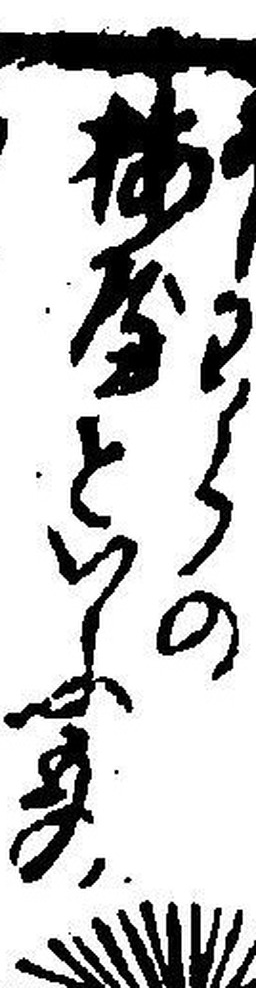梅屋といふもの
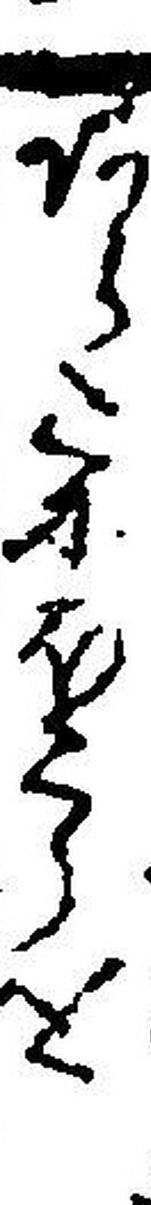あらたにほこらを
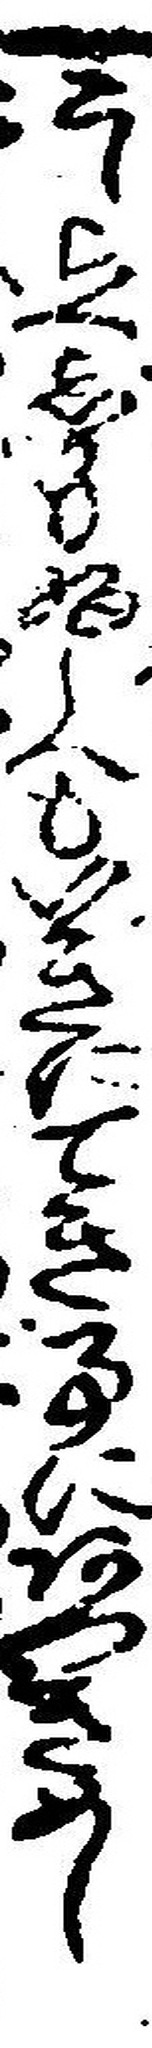こしらへしかもふしんもいきにてき事にあつきめし
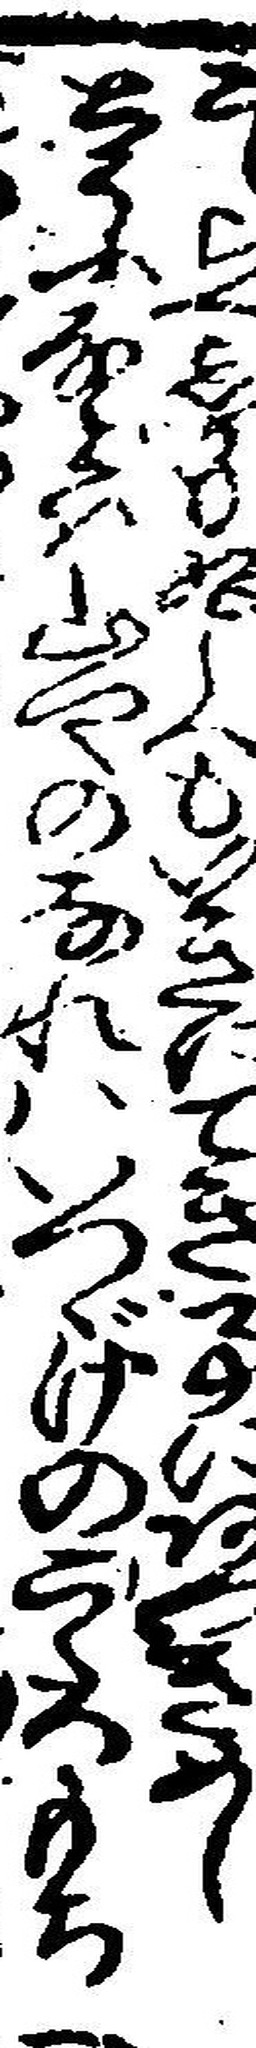とうふなどは山やのなれはいつゞけのこゝろもち
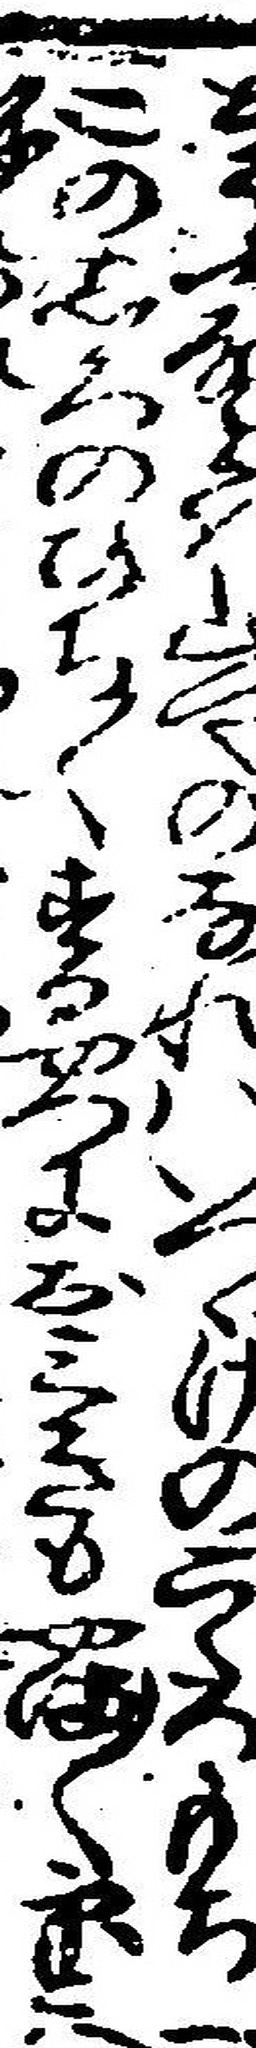このしろのひち〳〵するやつにおみきもやま〳〵印と
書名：間違狐之女郎買 / 市場通笑作
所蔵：東京大学総合図書館 General Library in the University of Tokyo, JAPAN
